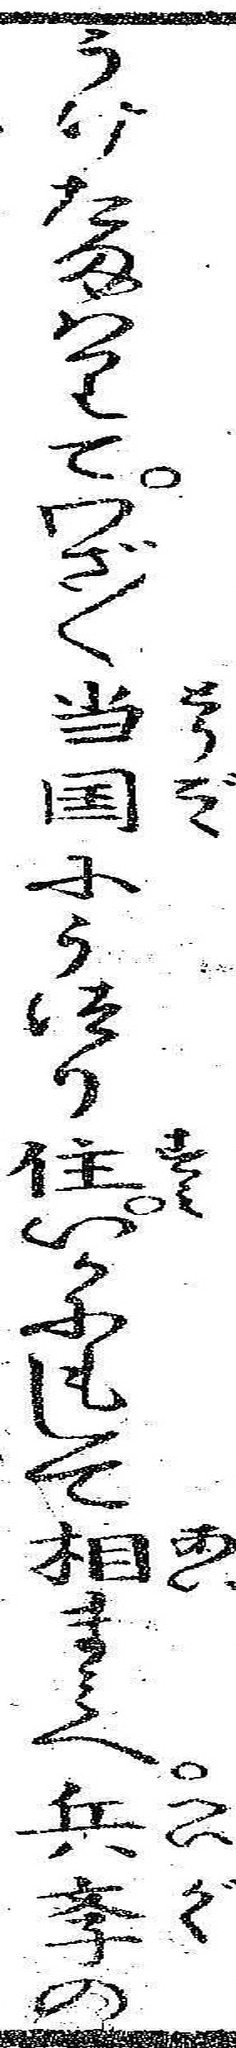うけたまはりて。わざ〳〵当国にうつり住。いかにもして相まみへ。兵学の

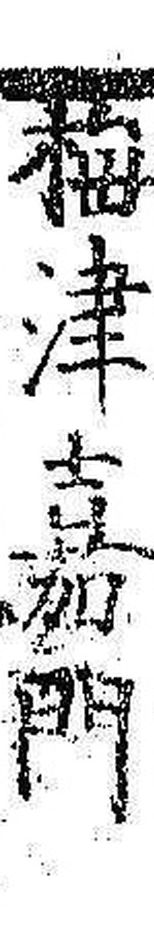梅津嘉門
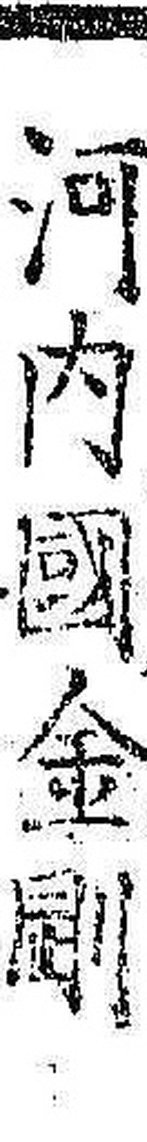河内国金剛
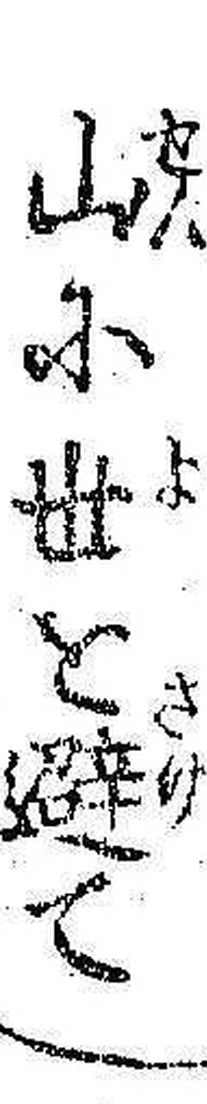山に世を避て
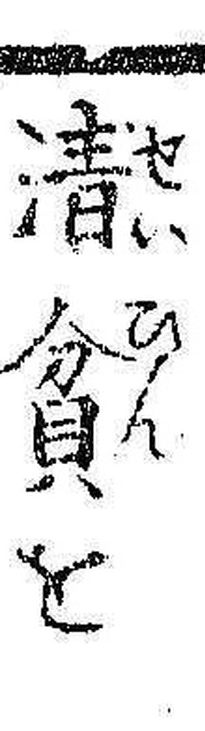清貧を
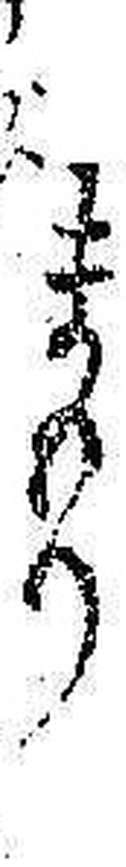まもり
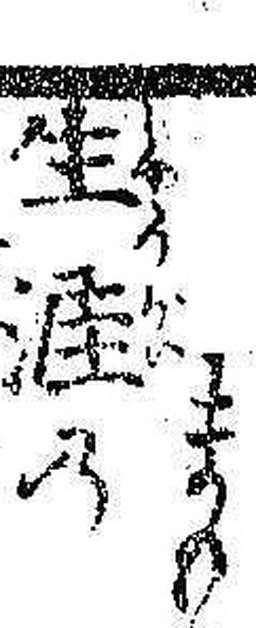生涯の
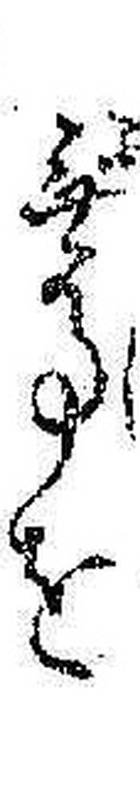無事を
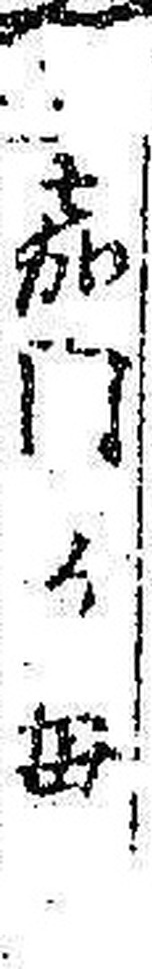嘉門の母
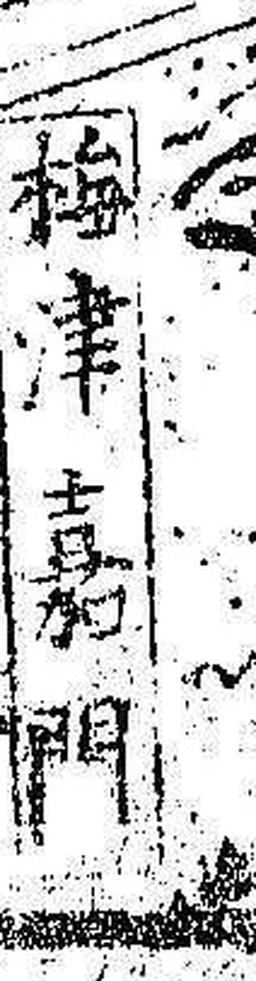梅津嘉門

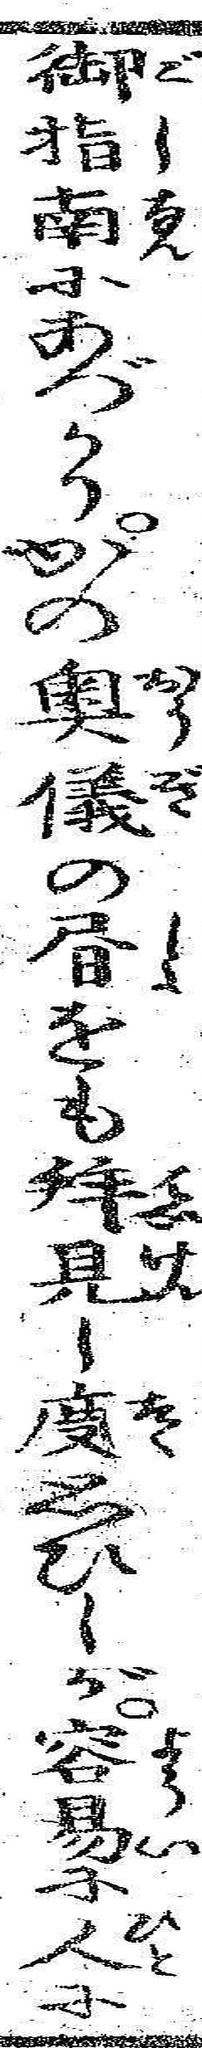御指南にあづかり。かの奥儀の書をも拝見し度思ひしが。容易に人に
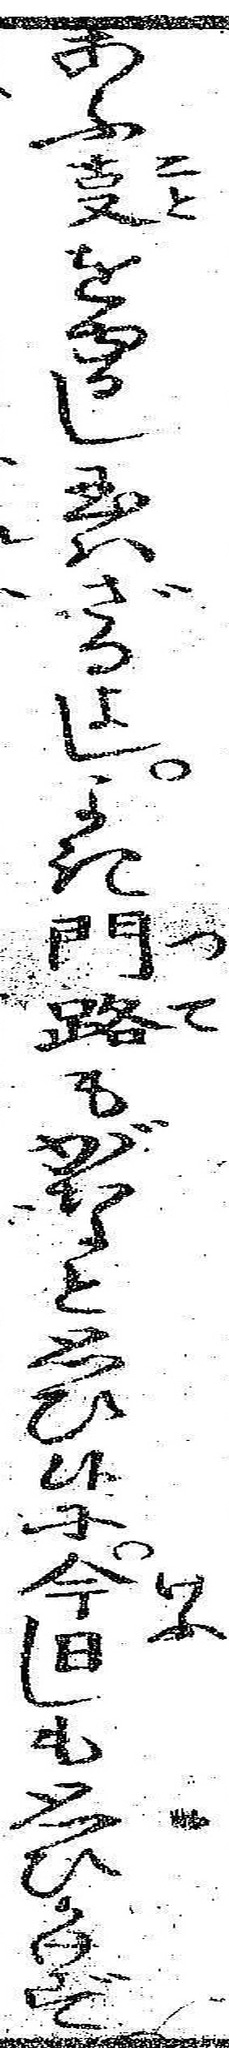あふ事をゆるし玉はざるよし。よき門路もがなと思ひ候に。今日しも思ひかけず
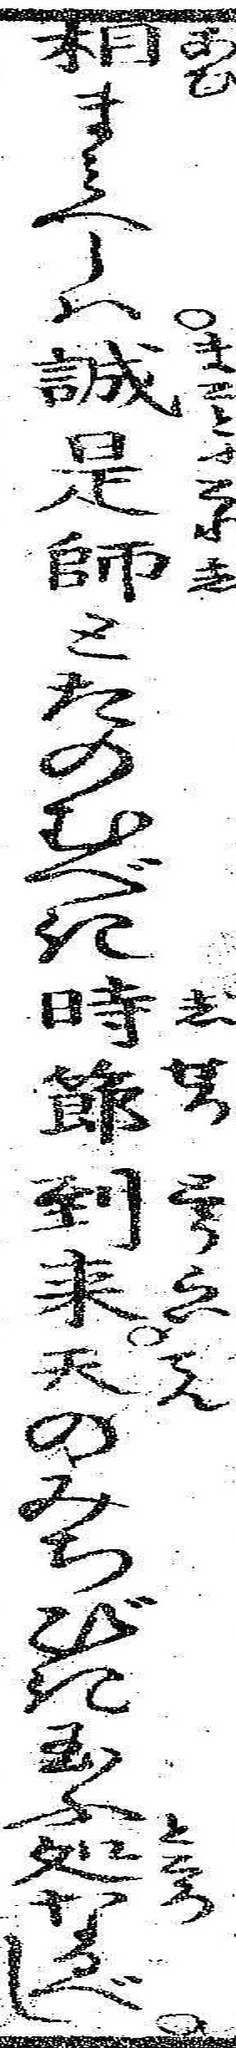相まみへしは。誠是師とたのむべき時節到来。天のみちびき玉ふ処なるべし。
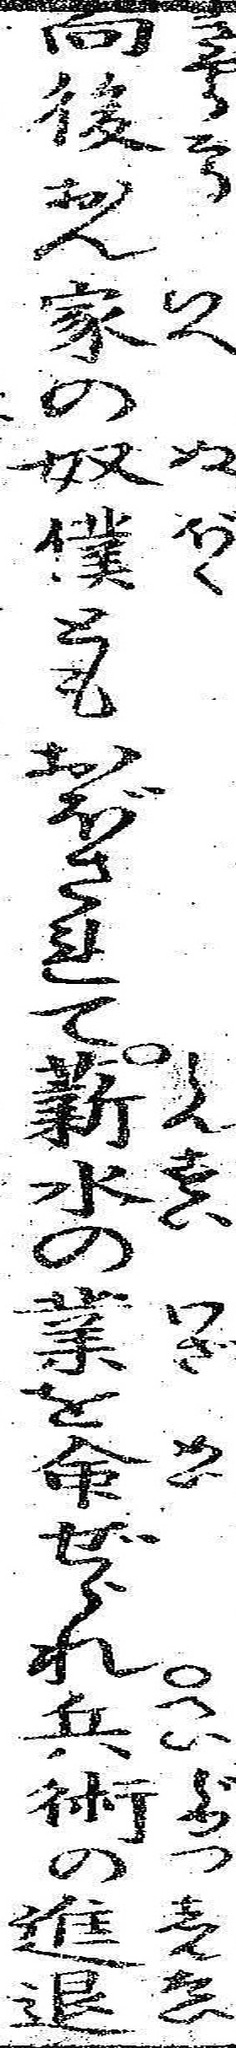向後おん家の奴僕ともおぼされて。薪水の業を命ぜられ。兵術の進退
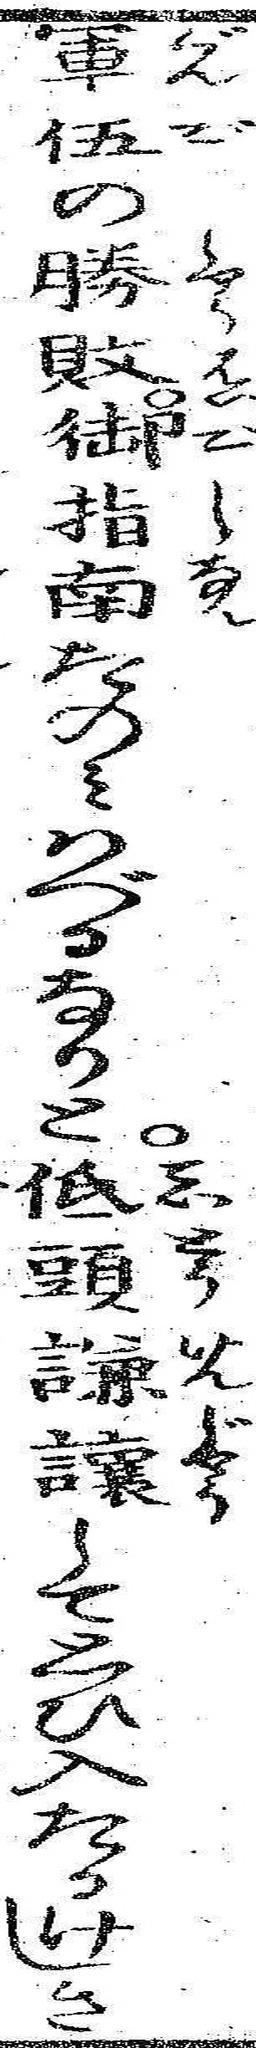軍伍の勝敗。御指南たのみはべるなりと。低頭謙譲して思ひ入たるけしき
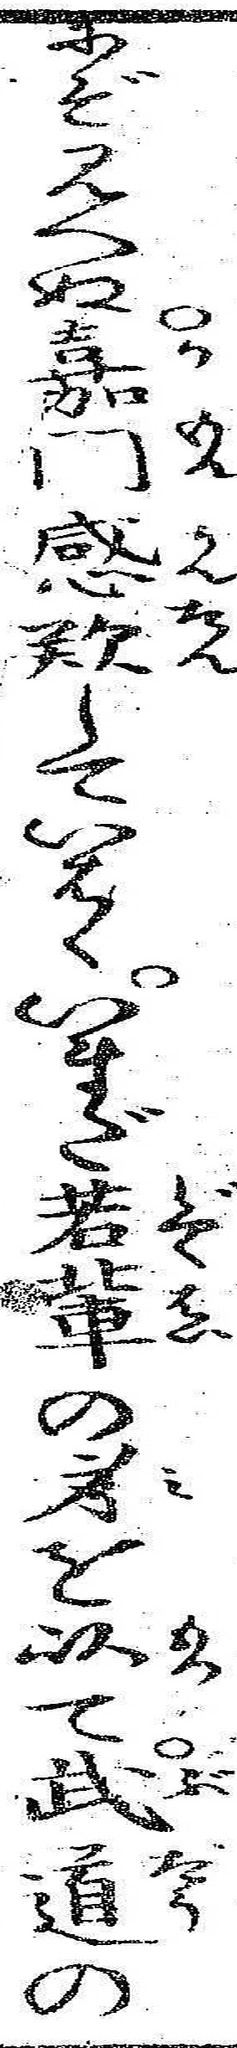にぞ見へぬ。嘉門感歎していはく。いまだ若輩の身を以て。武道の
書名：昔話稲妻表紙
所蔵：国文学研究資料館
